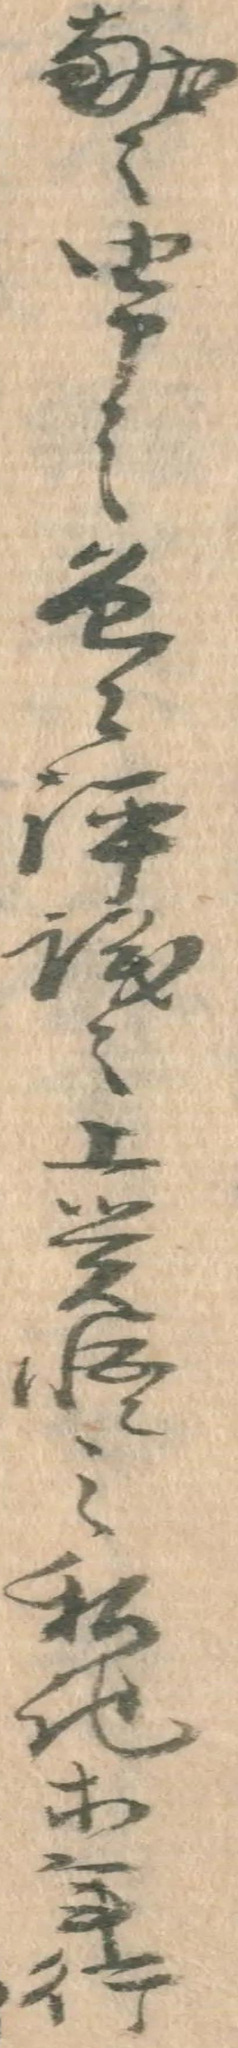献之由申之、色〻評議之上、覚悟之私他等年行事
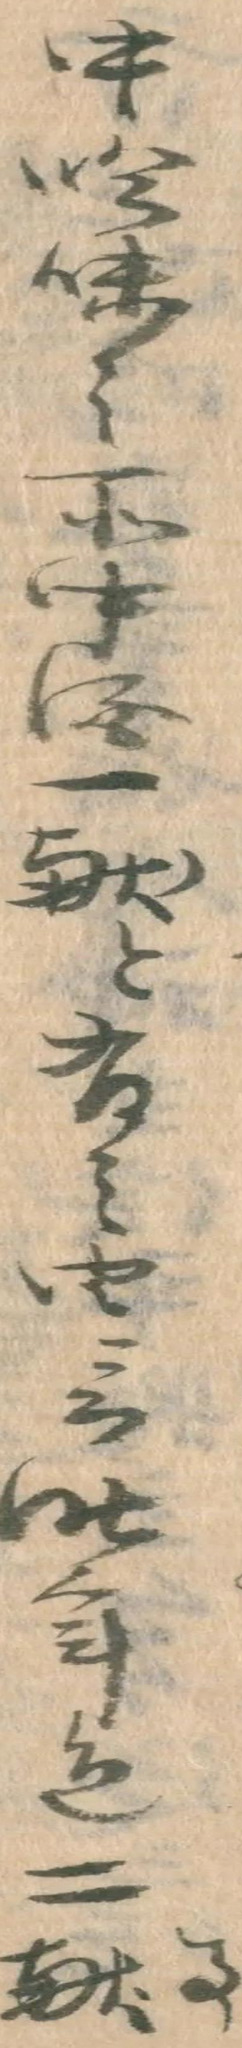中吟味之所、中酒一献と有之由二而、昨年迄二献
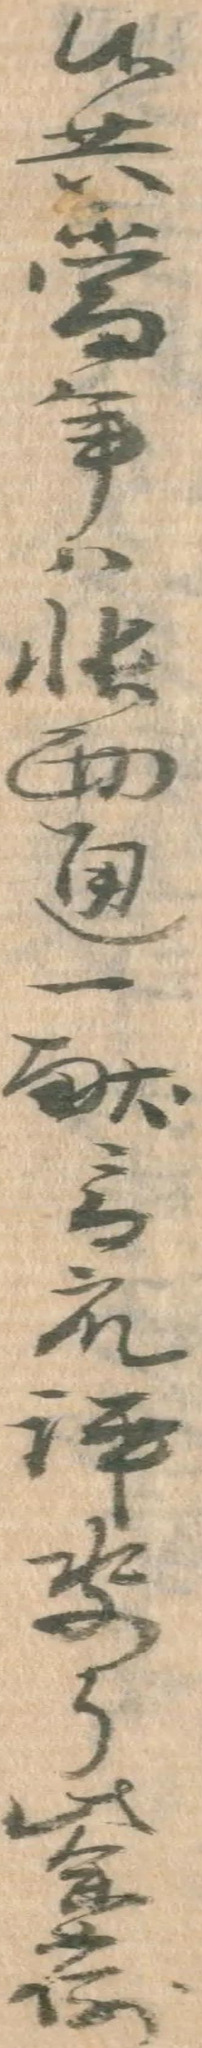候共、當年ハ帳面通一献二而衆評決了、此余如例、
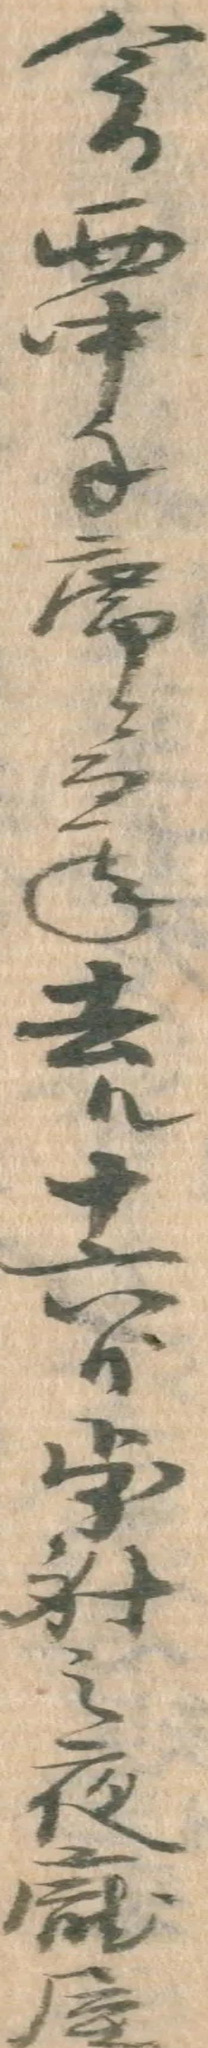今日西中手席ニ而年去ル、十六日歩射之夜、廳屋
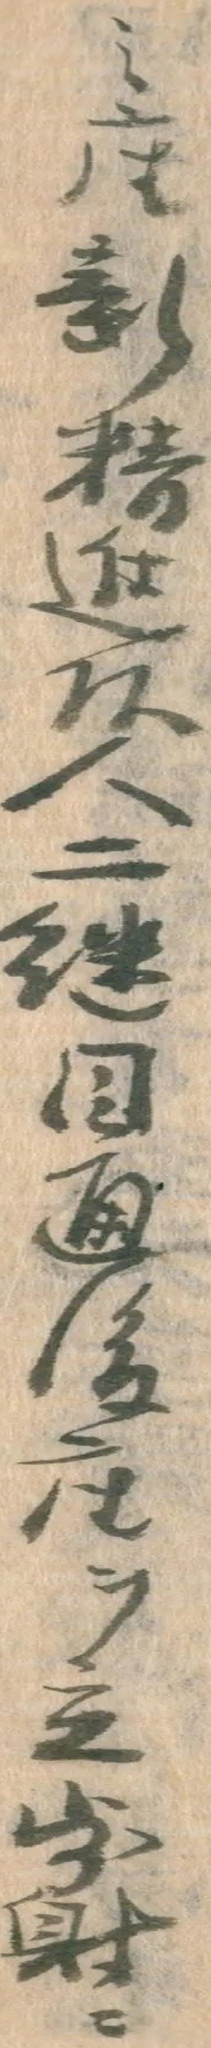之座、新精進頭人二継目通後座ヲ立、歩射二
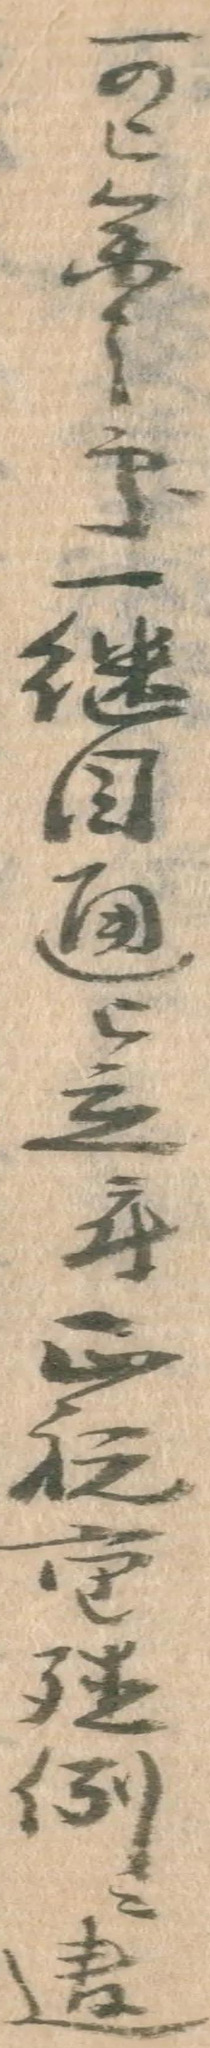可被参之処、一継目通被立ニ付、正祝重殖、例ニ違
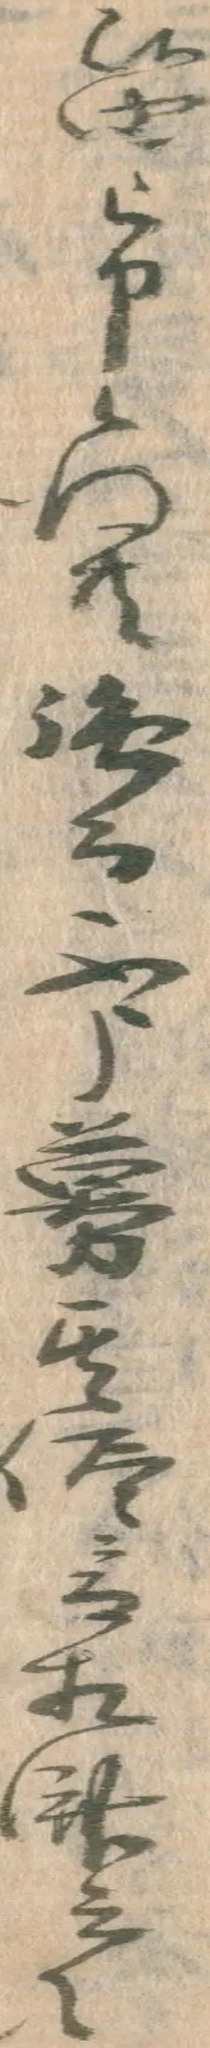候由被申候得共、強而不申募、其侭二而相済云々、
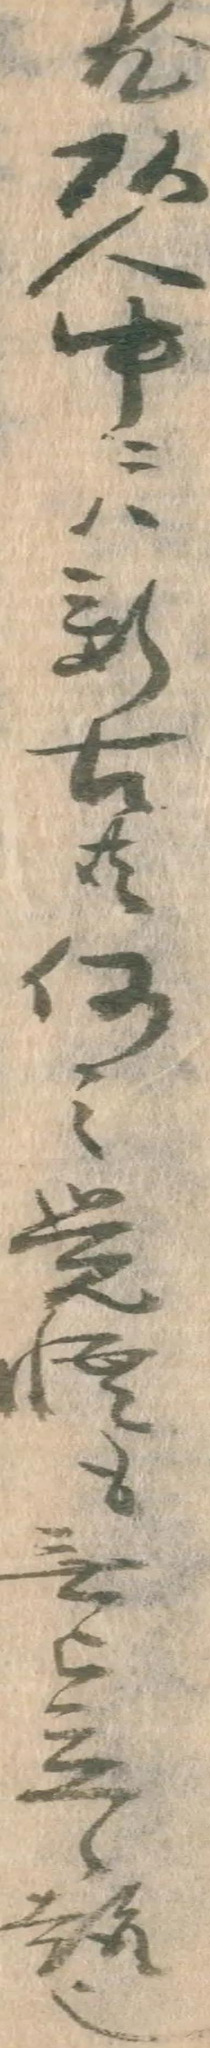尤頭人中ニハ、新古共何之覚悟も無被立候趣也、
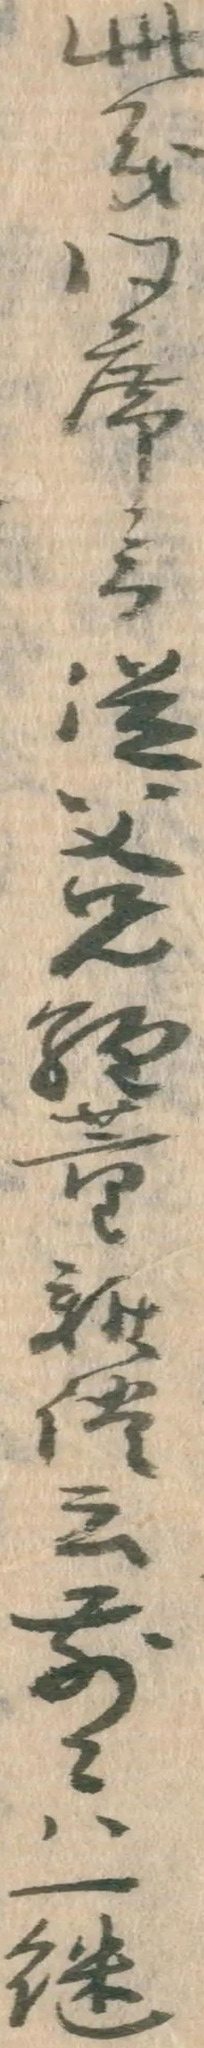此義同席ニ而従父兄顕薫雑談云、前々ハ一継
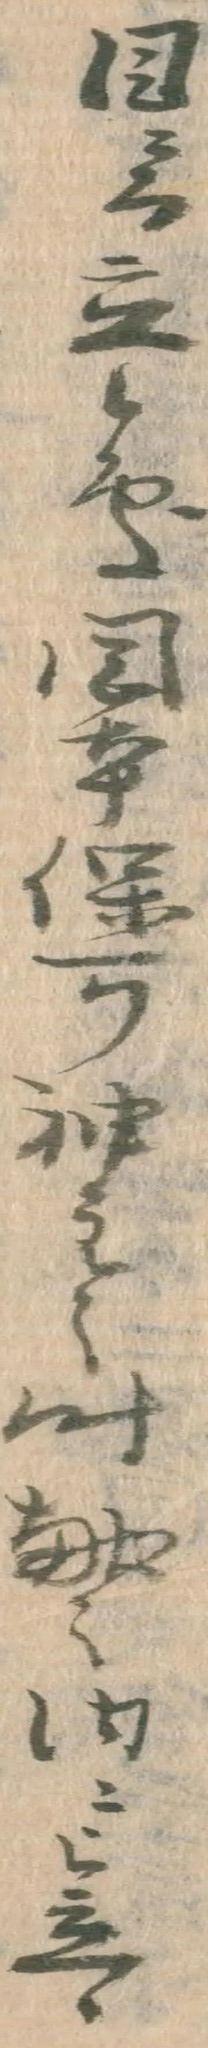目ニ而立候処、岡本保可神主之時、献之内ニ被立候

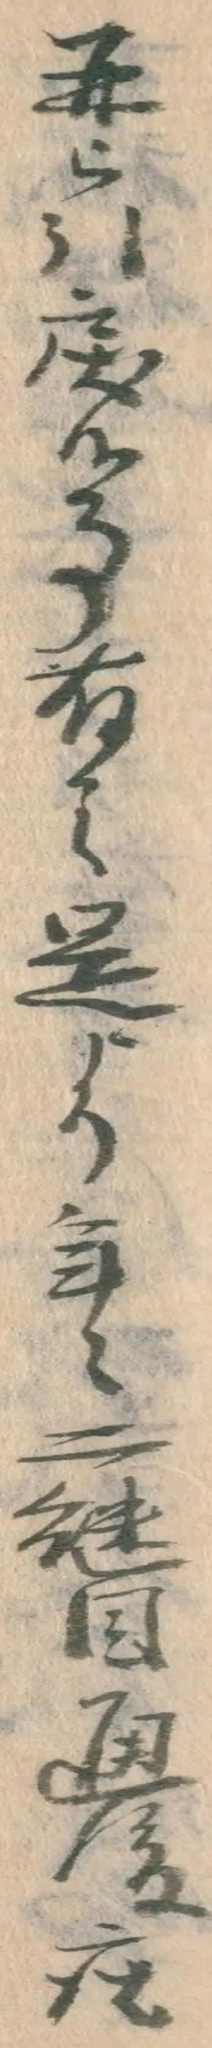幷被引戻候事有之、是より年々二継目通後座
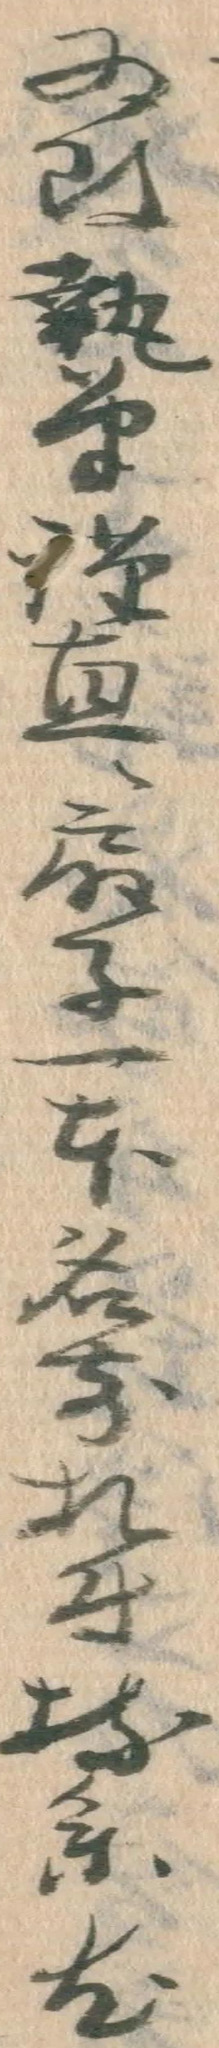為改、執筆謹直ニ扇子一本名前札付持参、尤
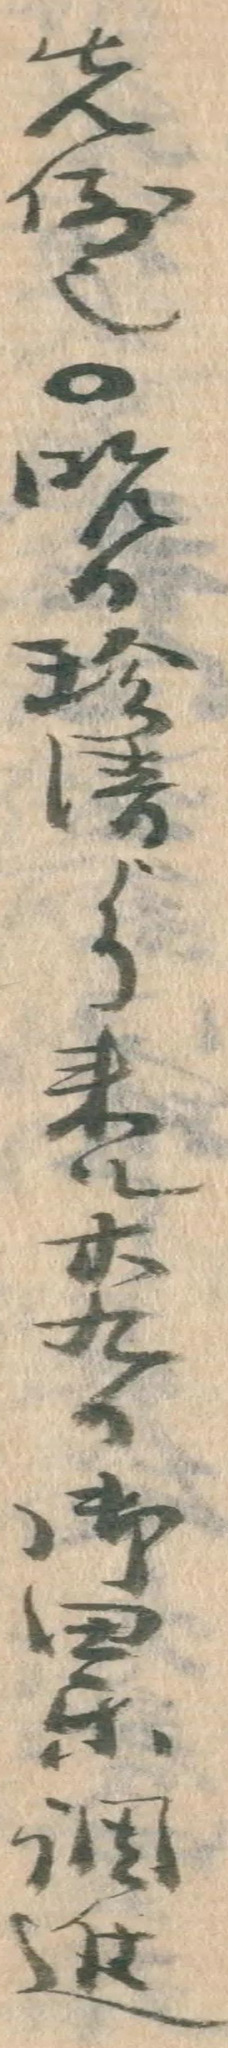先例也○昨日珍清より、来ル廿九日御田楽調進
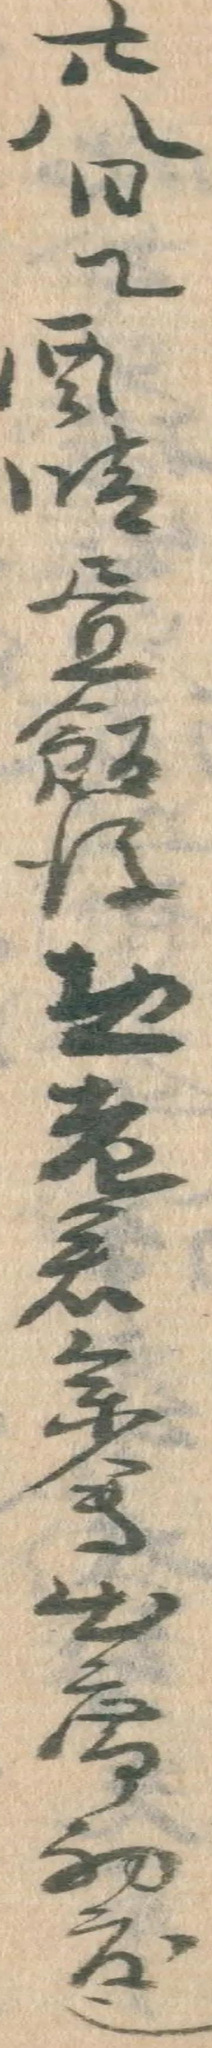廿八日乙酉晴、昼飯後惣老若参會出席、初度也、
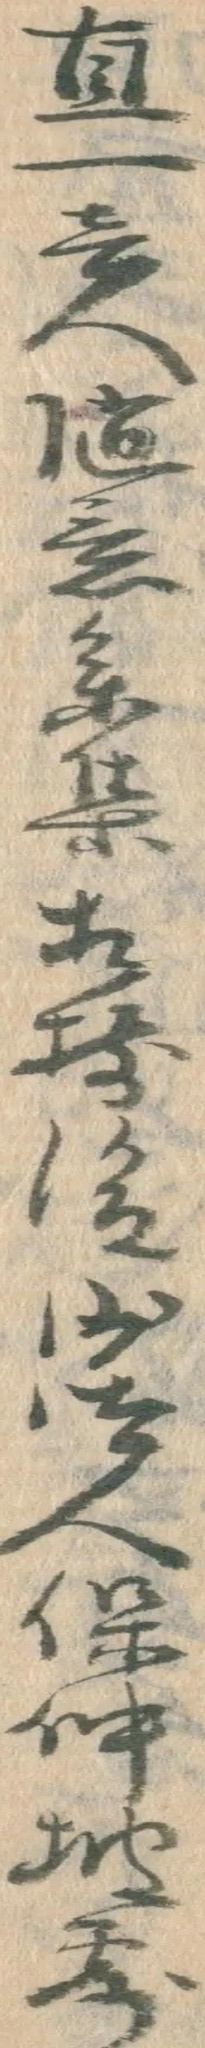直一壱人随意参集、相揃後、沙汰人保仲披露、
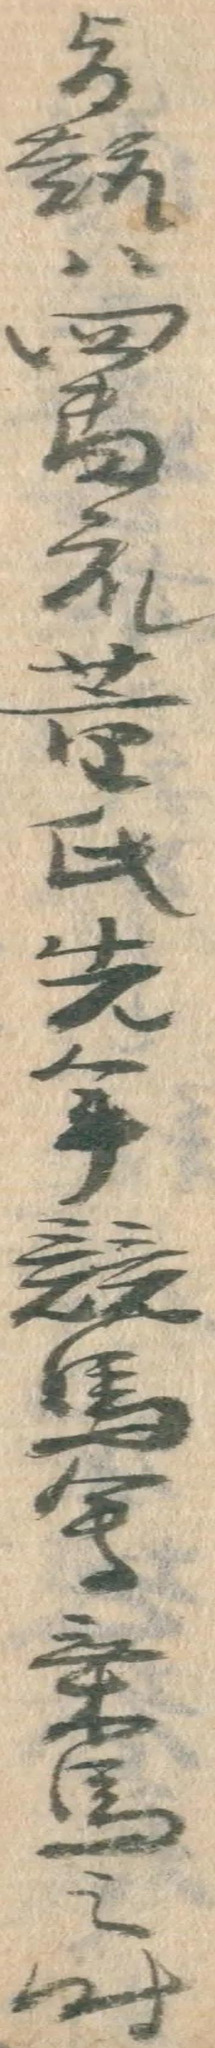旨趣ハ、四番衆董氏、先年競馬会乗馬之時、
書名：賀茂社記録. 第63冊
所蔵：国立国会図書館 National Diet Library, JAPAN
